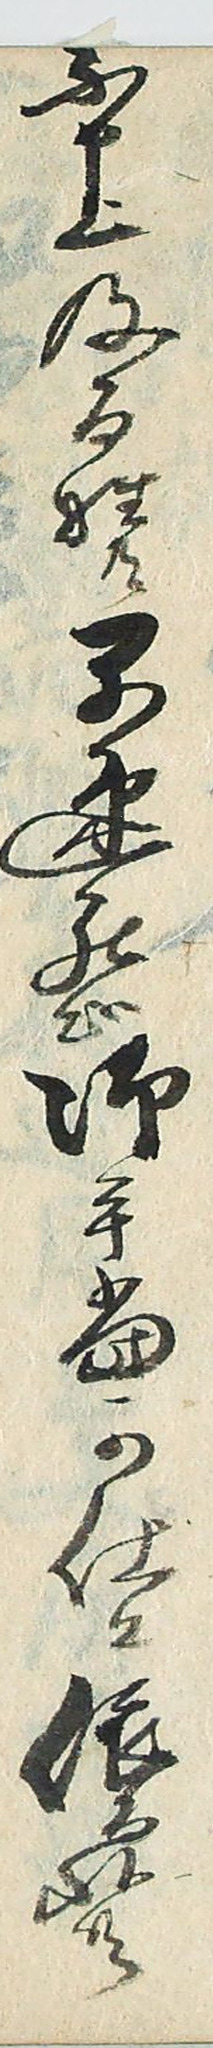不申上及百姓共早速罷出御手当可仕候依而私共
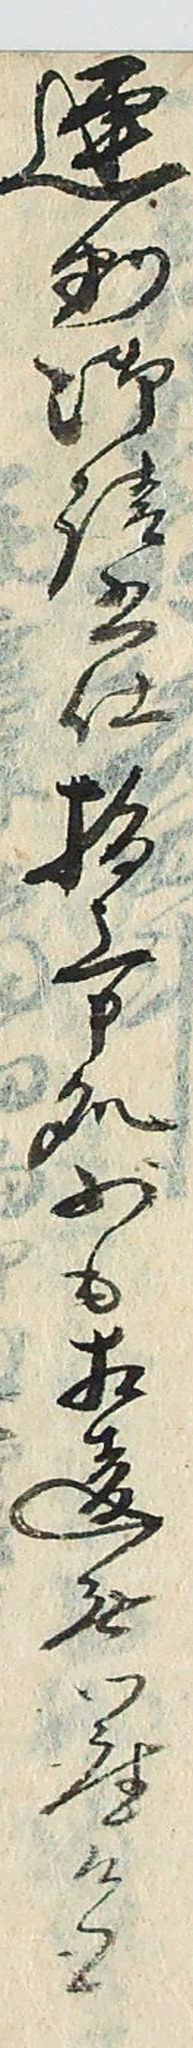連判御請書仕指上申処少も相違無御座候以上
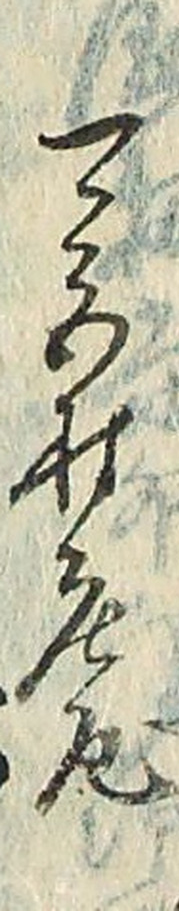一宮村庄屋
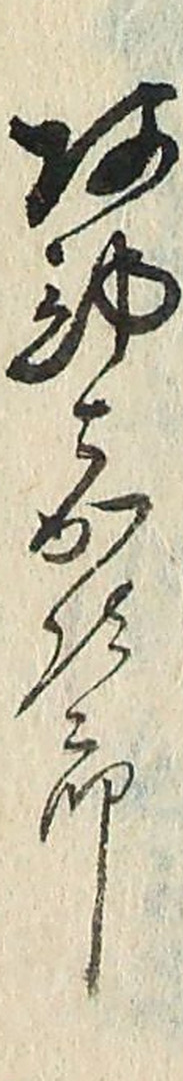阿部嘉次郎
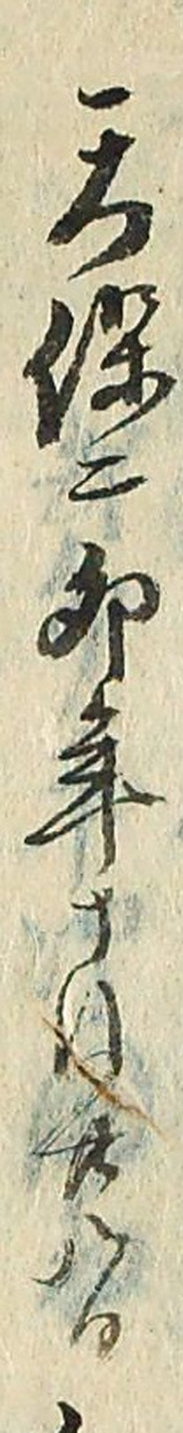天保二卯年十月廿八日
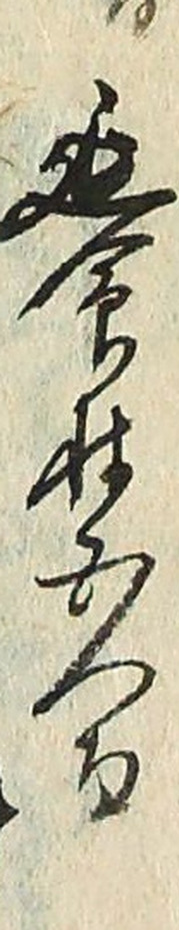延命村五人与
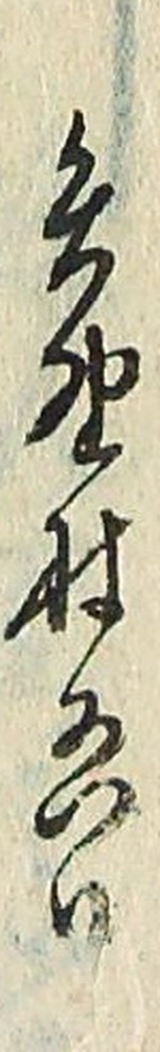矢野村右同
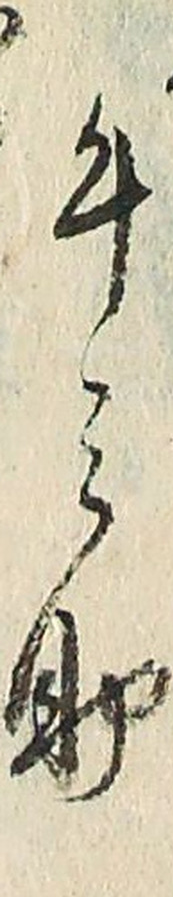牛之助
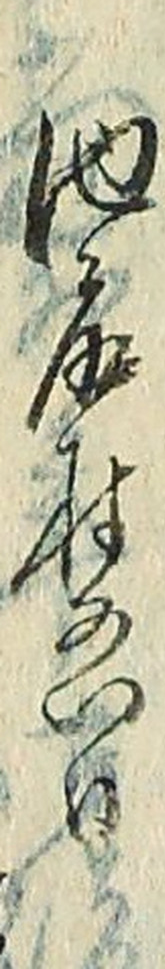矢野村右同
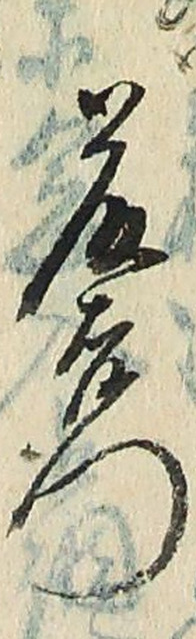藤右衛門
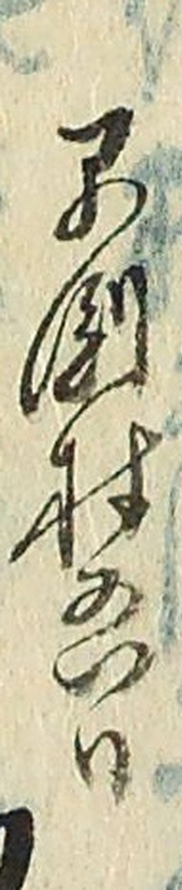早渕村右同
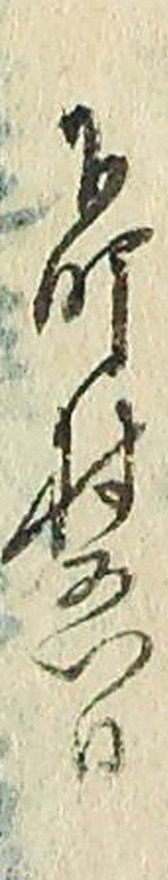下町村右同
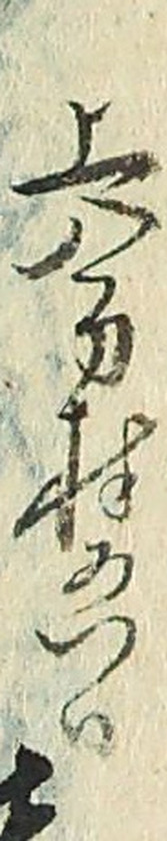上八万村右同
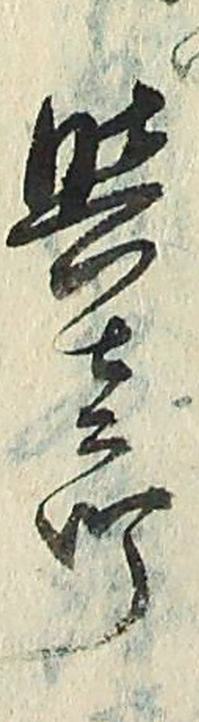与七郎
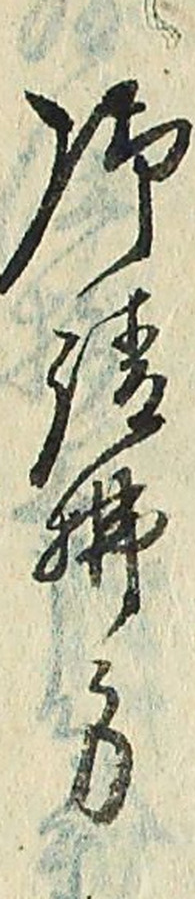御請払方
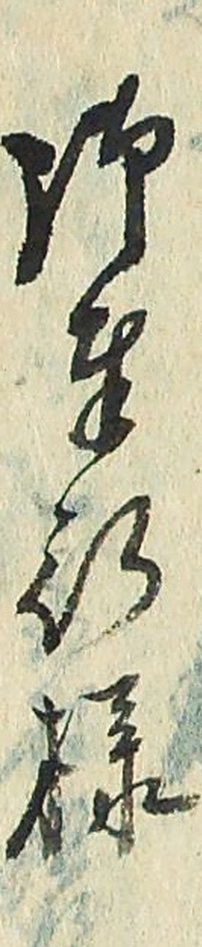御奉行様
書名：諸御用御□受書控
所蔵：鳴門教育大学 Naruto University of Education
